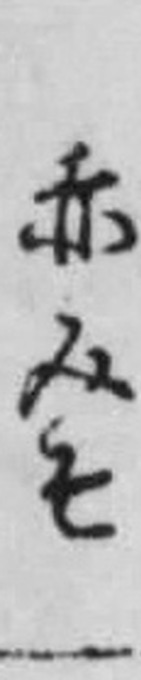赤みそ
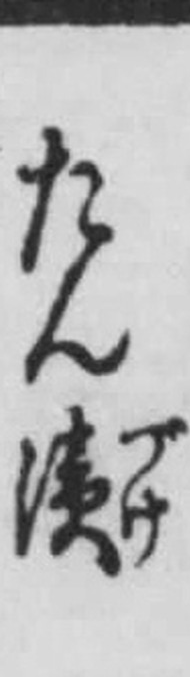たん漬
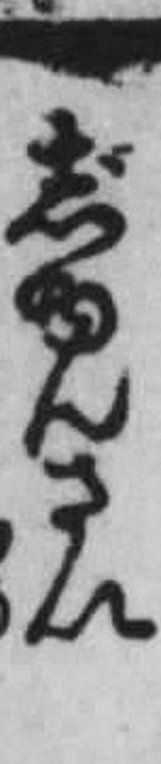じゆんさい
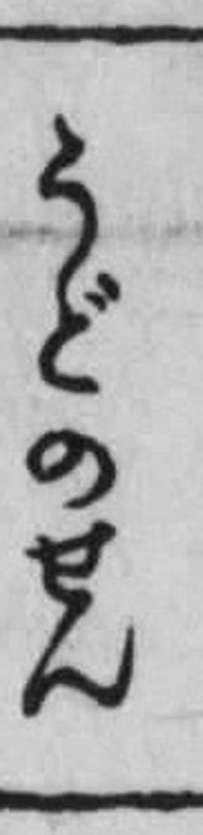うどのせん
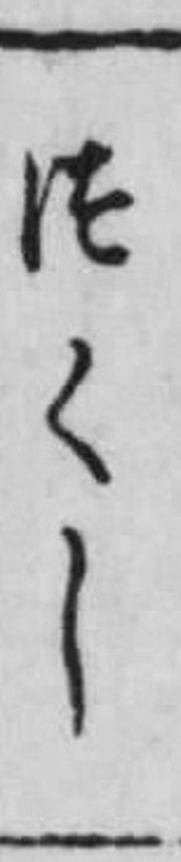つくし
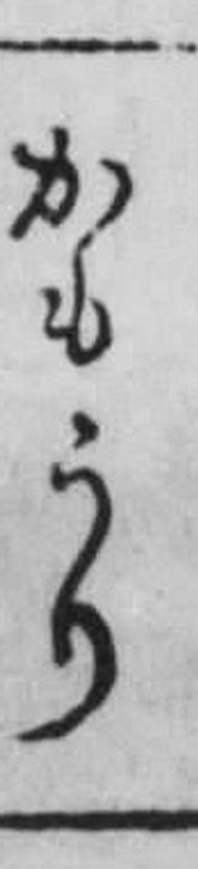かもうり
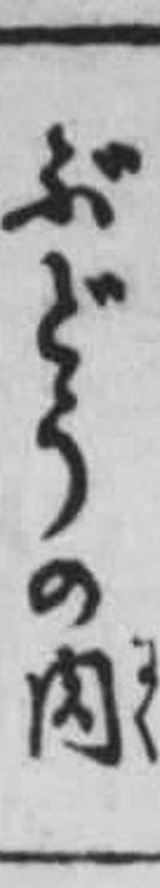ぶどうの肉
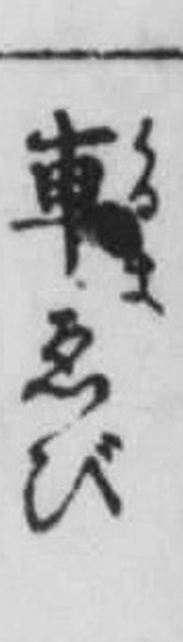車ゑび
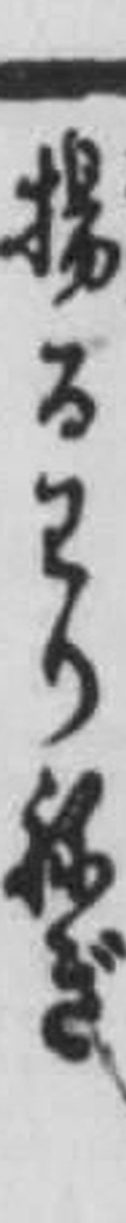揚るわりねぎ
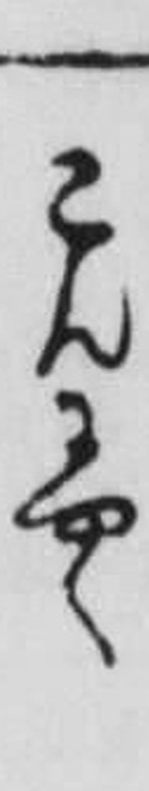こんにやく
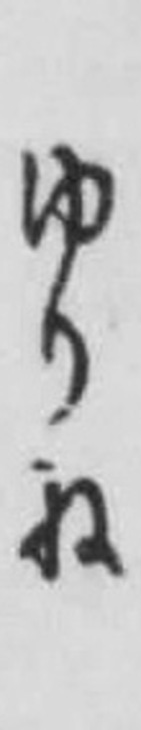ゆりね
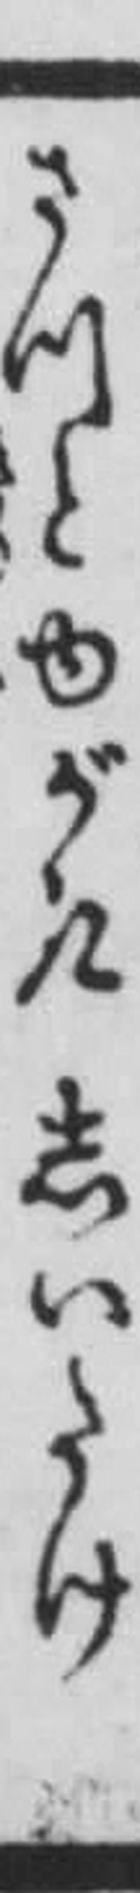さつとゆがきしいたけ
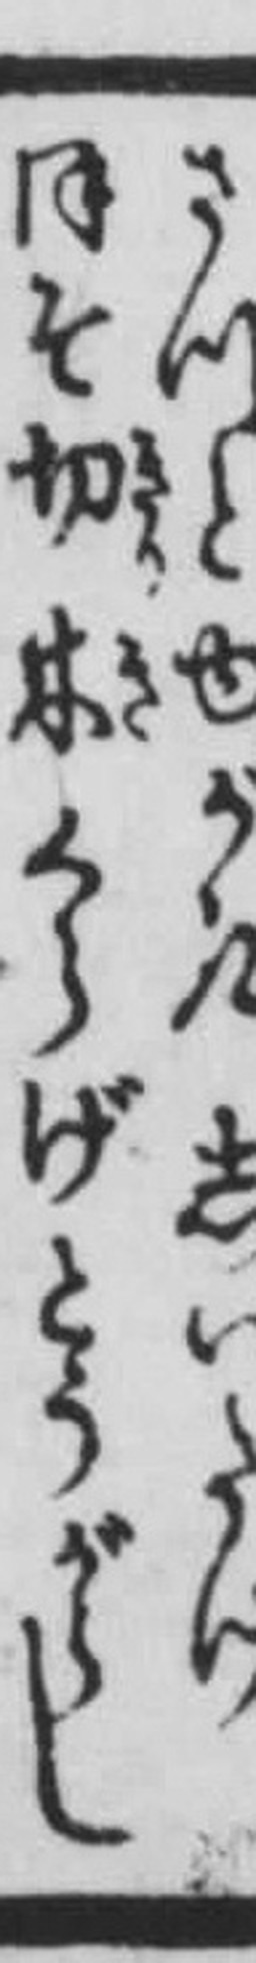ほそ切木くらげとうがらし
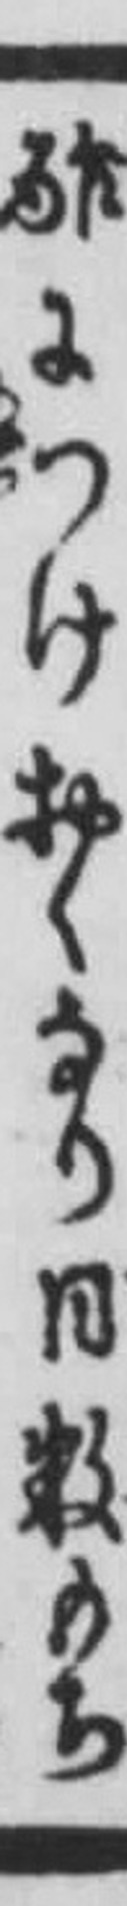酢につけおくなり日数もち
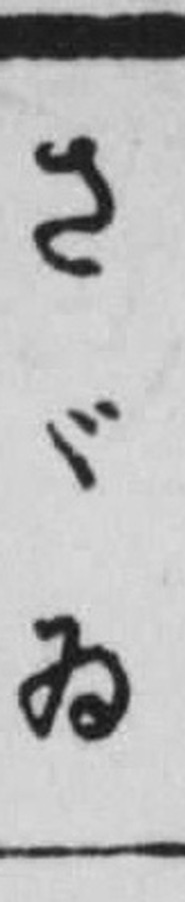さゞゐ
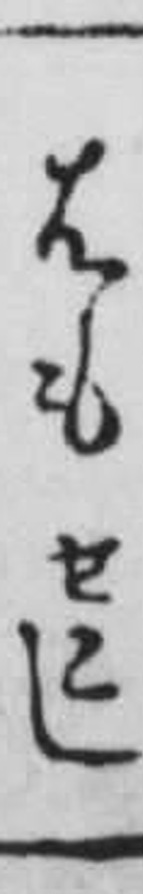はもせこし
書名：日用重宝魚類精進/料理早工風
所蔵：大阪府立大学学術情報センター 国文学研究資料館
